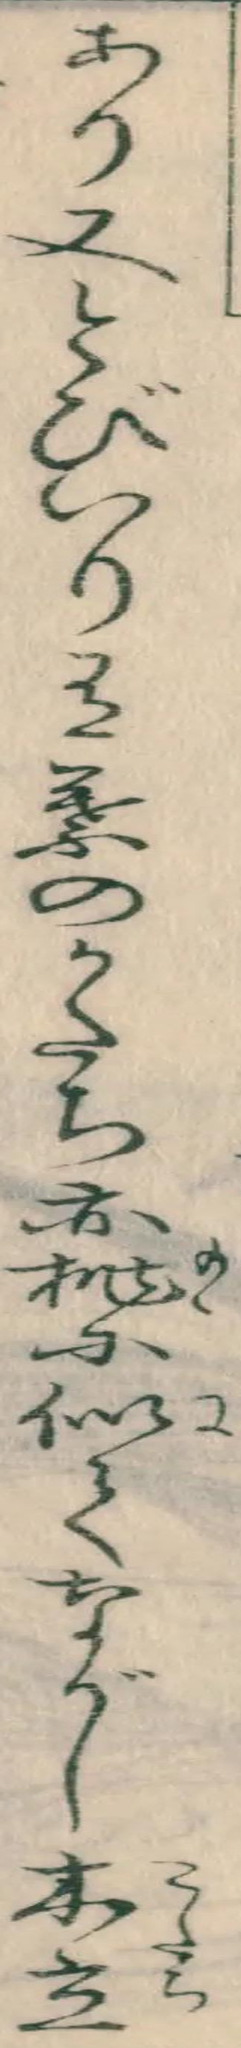あり又とびいり有葉のかたち亦桃に似てながし木立
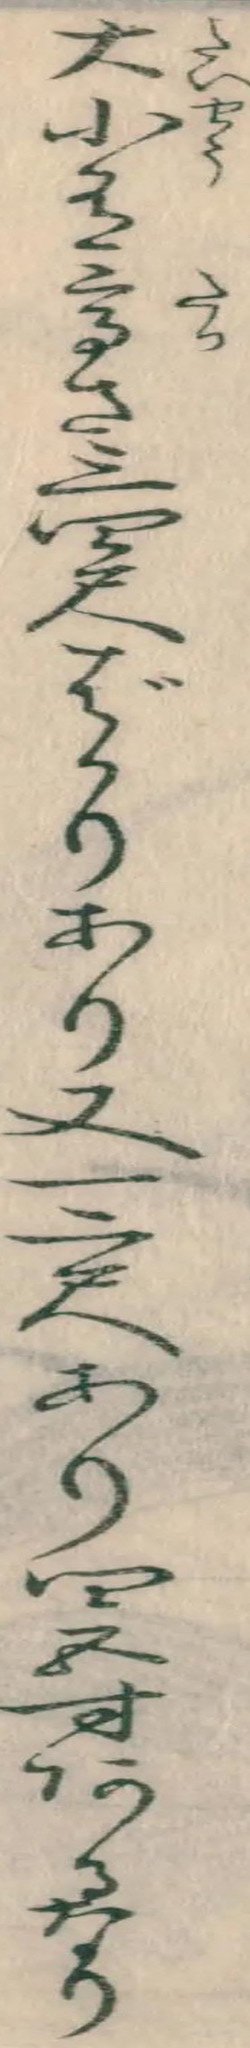大小有高さ三四尺ばかりあり又一二尺あり四五寸あるなり
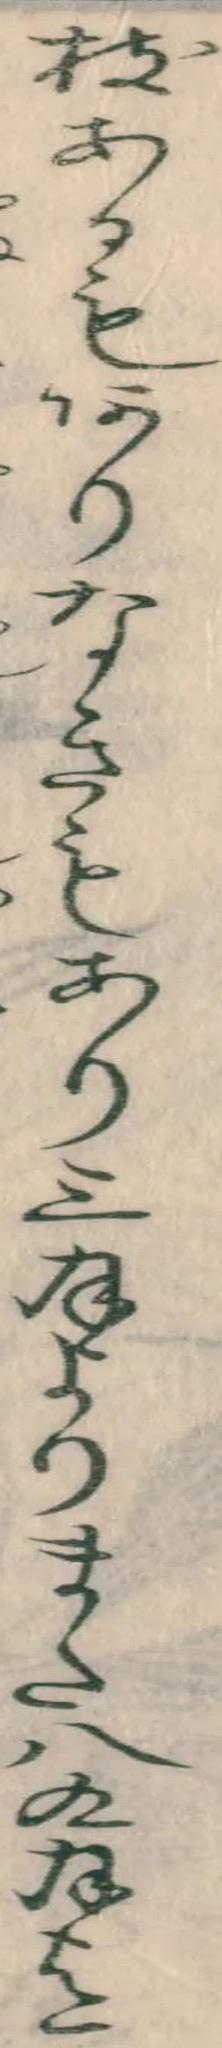枝あるもありなきもあり三月よりまた八九月迄
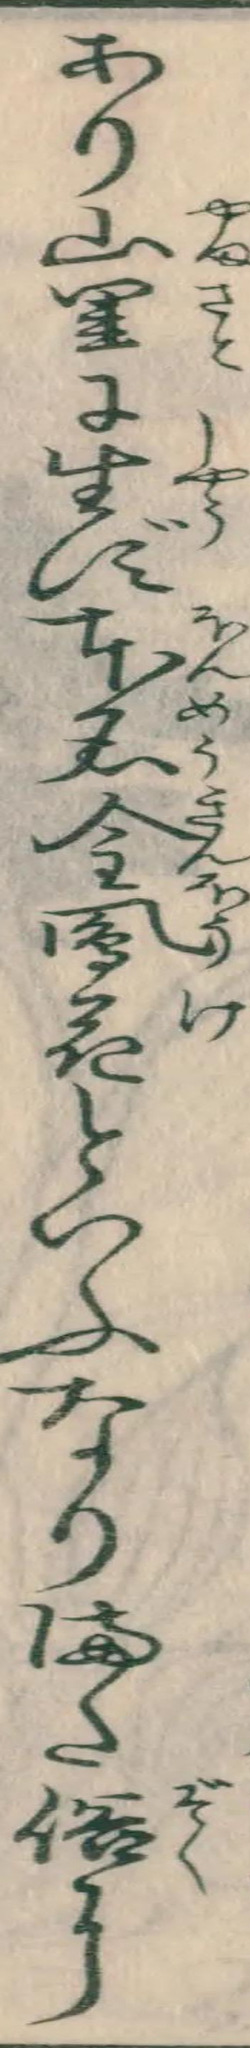あり山里に生ず本名金鳳花といふなりまた俗に
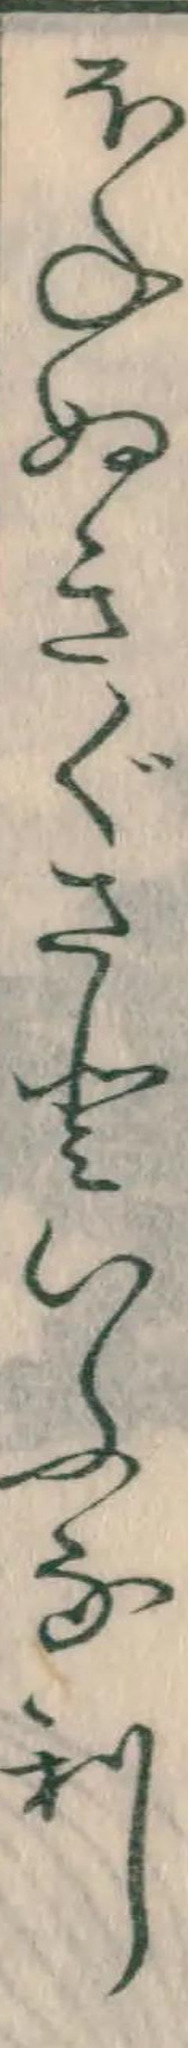ほねぬきぐさといふなり
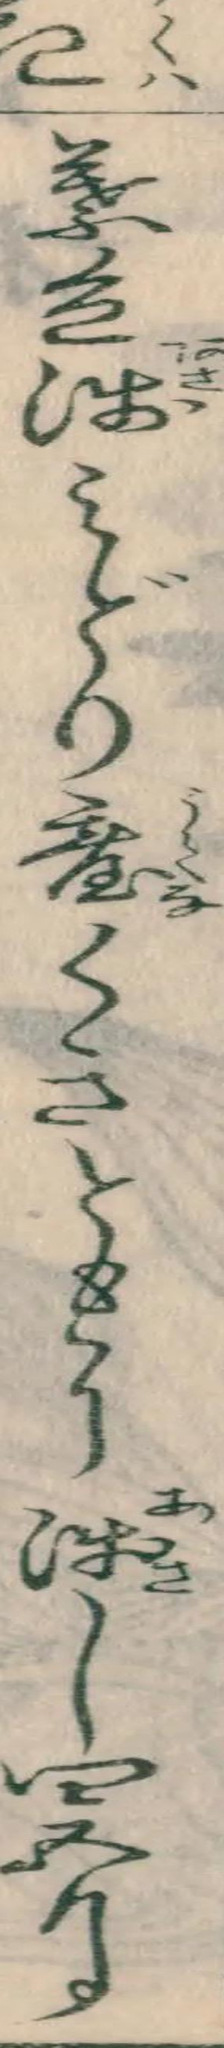葉色浅みどり台くきともに浅し四五月
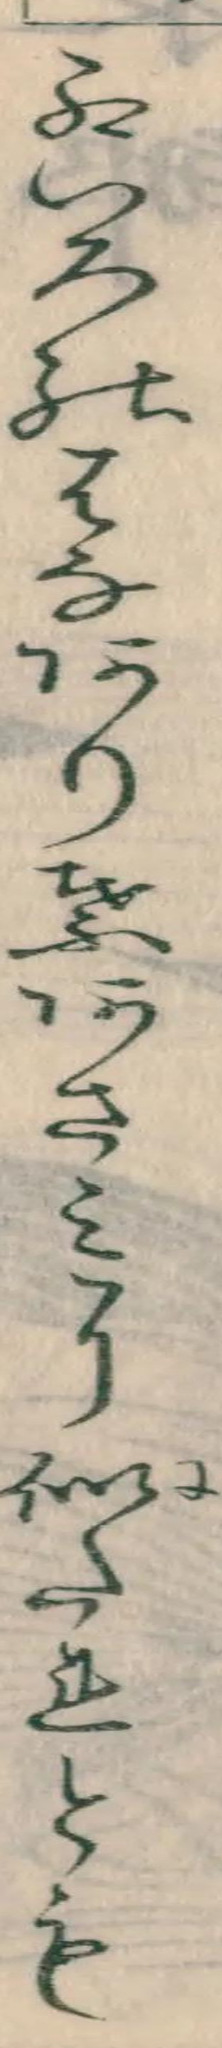紅いろのはなあり葉あさみに似たれとも
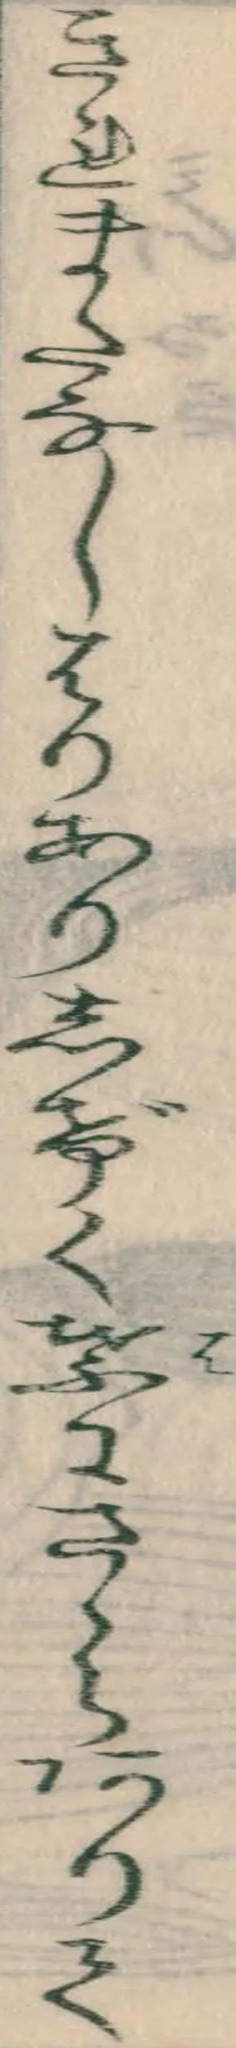きれまたなしはりありしげく葉にさゝらありて
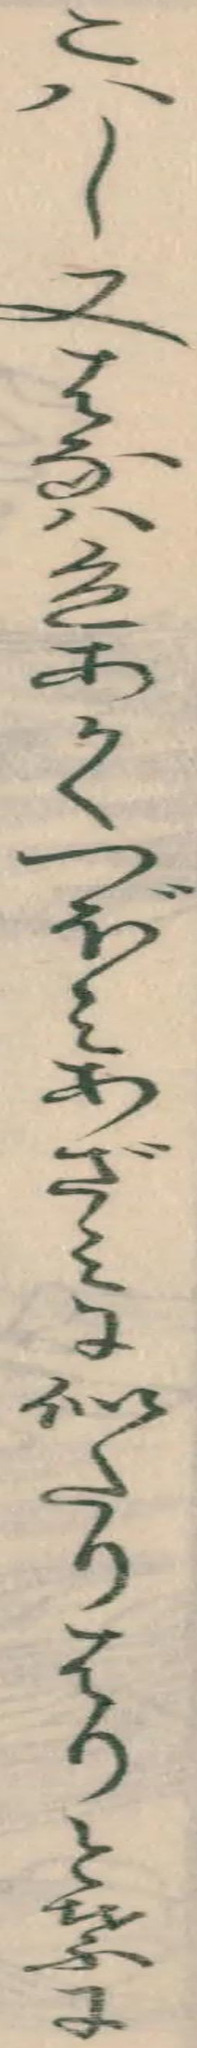こはし又はなは色あかくつぼみあざみに似たりはりと葉に
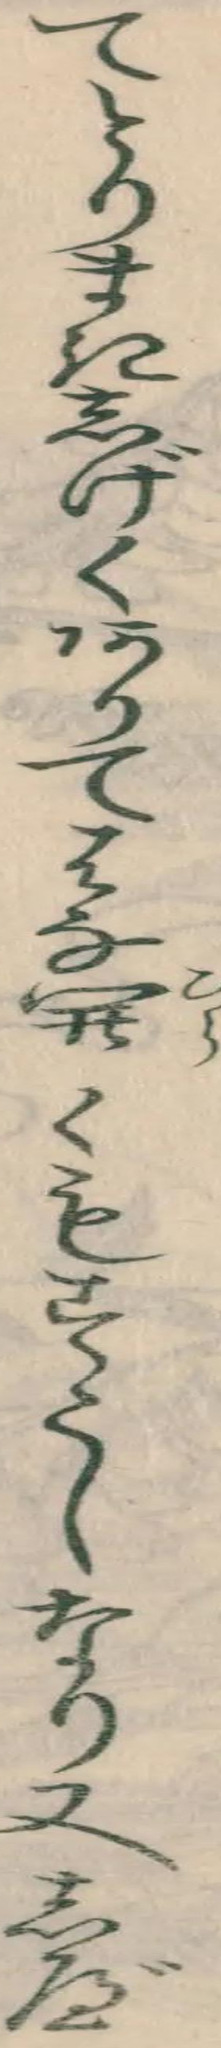てとりまきしげくありてはな開くもすこしなり又しべ
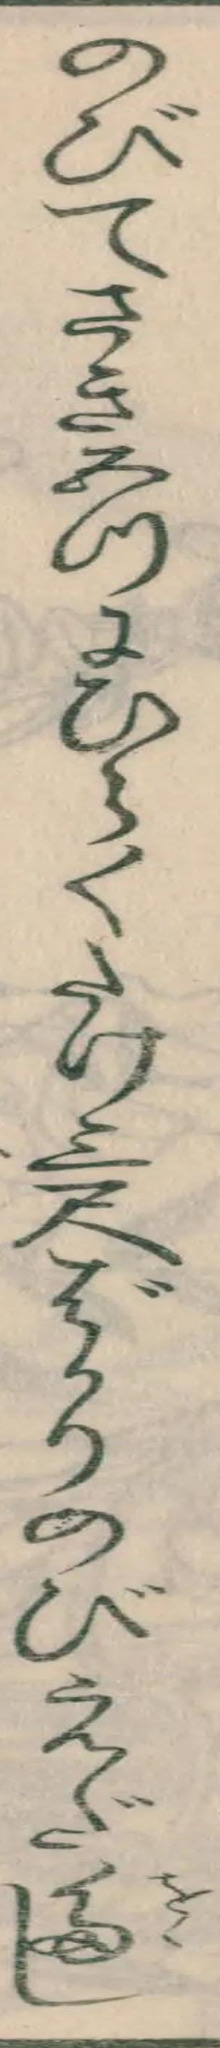のびてさき五つにひらくたけ三尺ばかりのびえだ多し
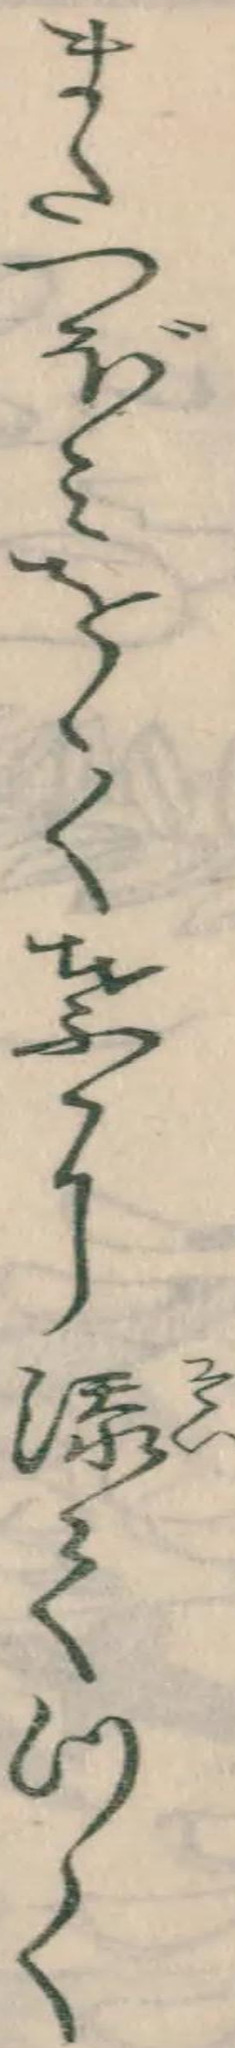またつぼみをゝく葉に添てつく
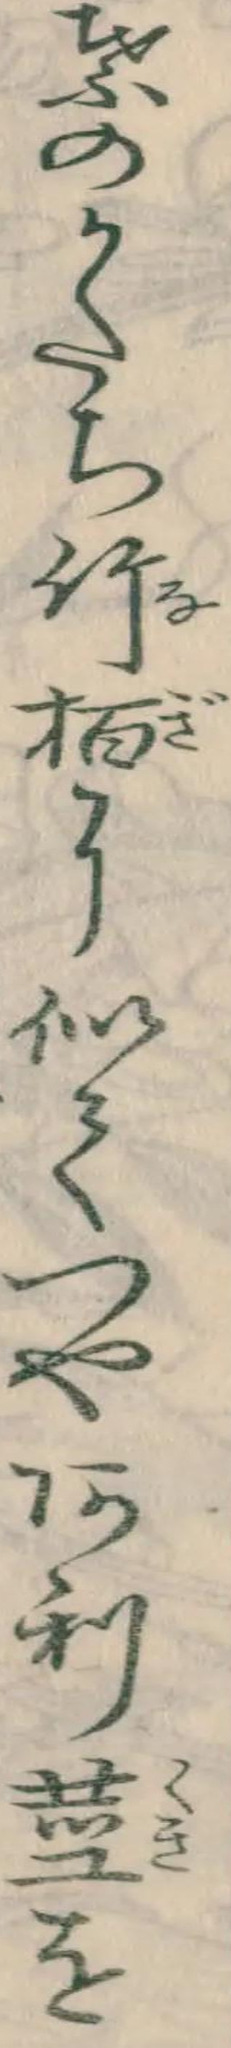葉のかたち竹柏に似てつやあり茎を
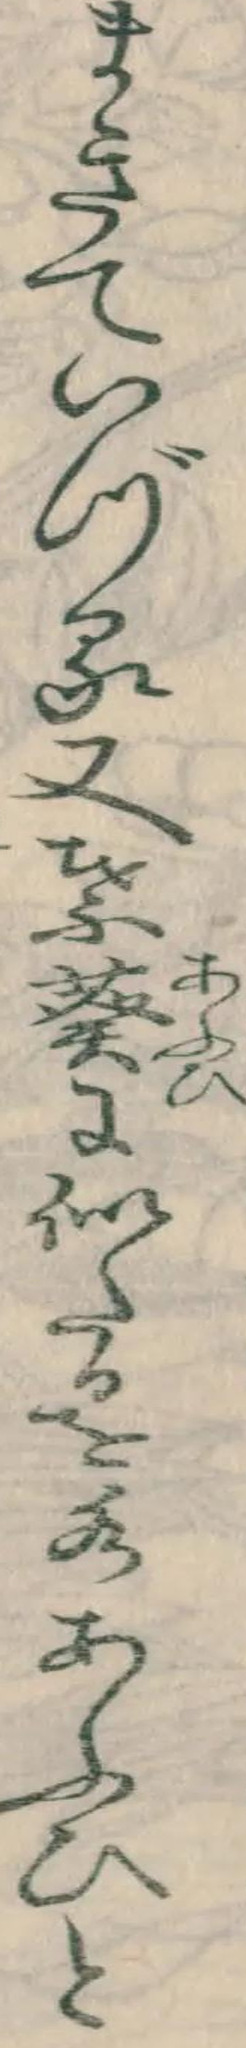まきていづる又葉葵に似たるを水あふひと
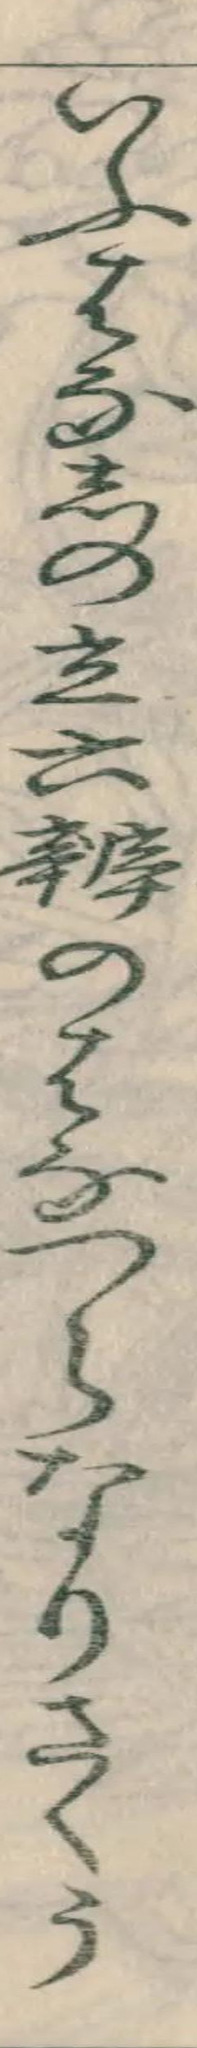いふはなしの立六弁のはなつらなりさくう
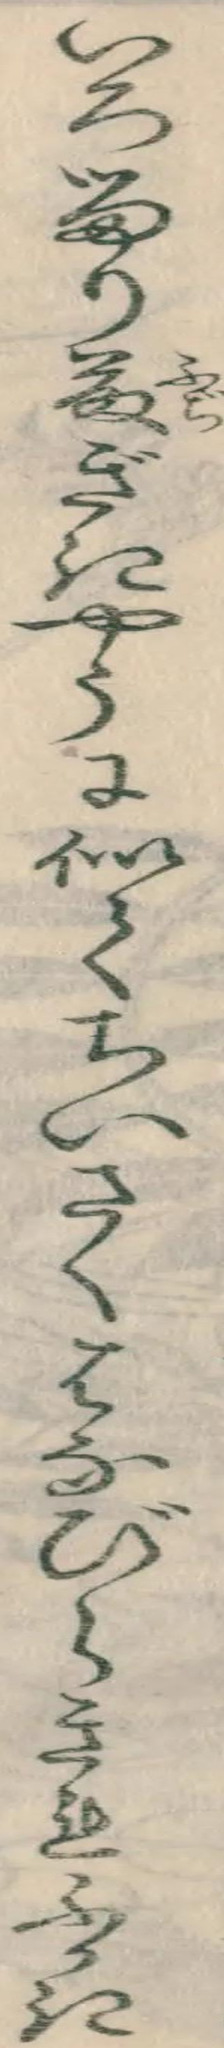いろるり藤ぎきやうに似てちいさくはなびらきれふかき
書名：畫本野山草. [4]
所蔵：国立国会図書館 National Diet Library, JAPAN
